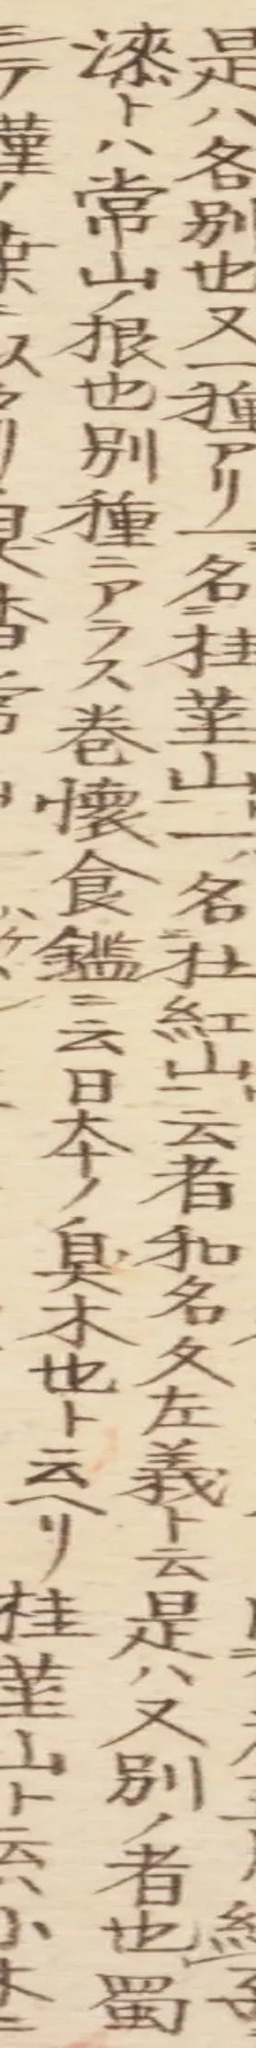漆トハ常山ノ根也別種ニアラス巻懐食鑑ニ云日本ノ臭木也ト云ヘリ桂茎山ト云ハ小木ニ
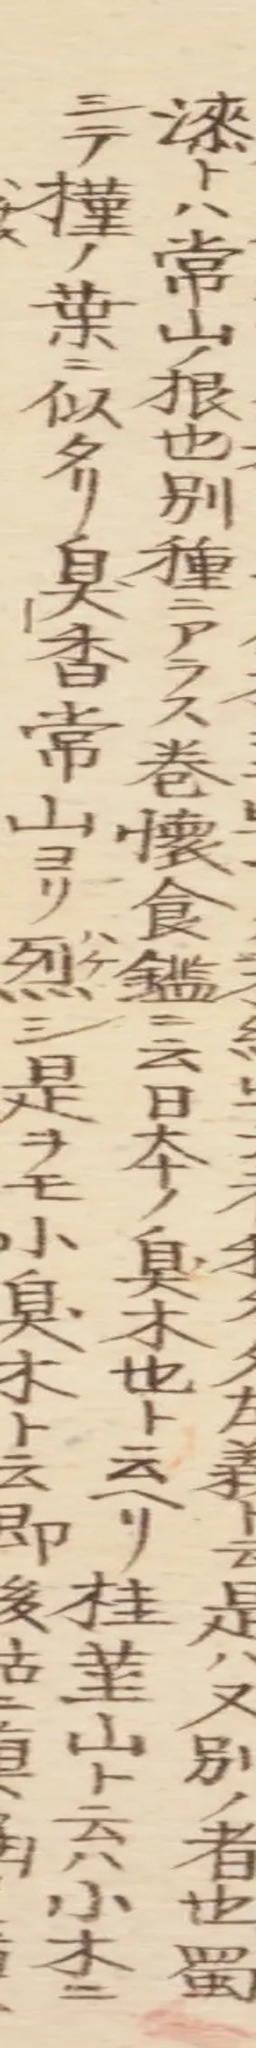シテ槿ノ葉ニ似タリ臭-香常山ヨリ烈シ是ヲモ小臭木ト云即後怙ニ真ヲ著ス
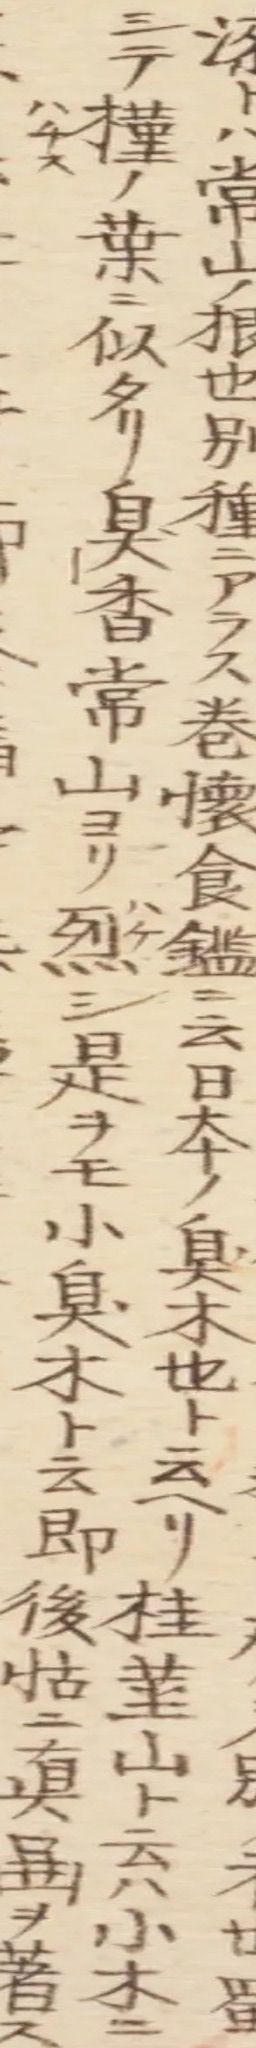シテ槿ノ葉ニ似タリ臭-香常山ヨリ烈シ是ヲモ小臭木ト云即後怙ニ真ヲ著ス
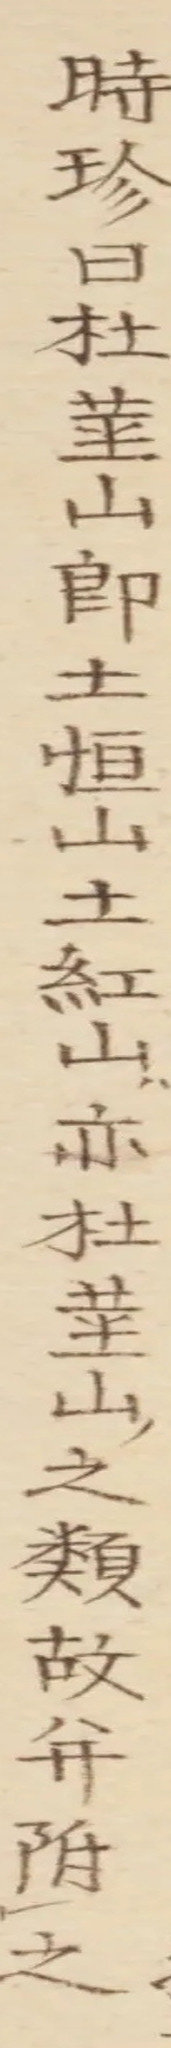時珍曰杜茎山即土恒山土紅山亦杜茎山之類故并附之
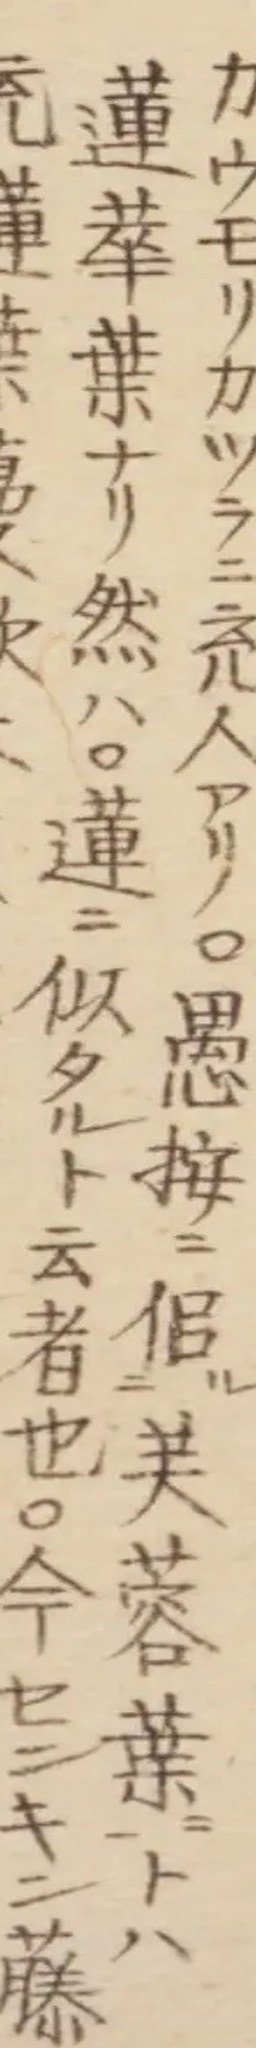蓮華葉ナリ然ハ○蓮ニ似タルト云者也○今センキン藤ニ
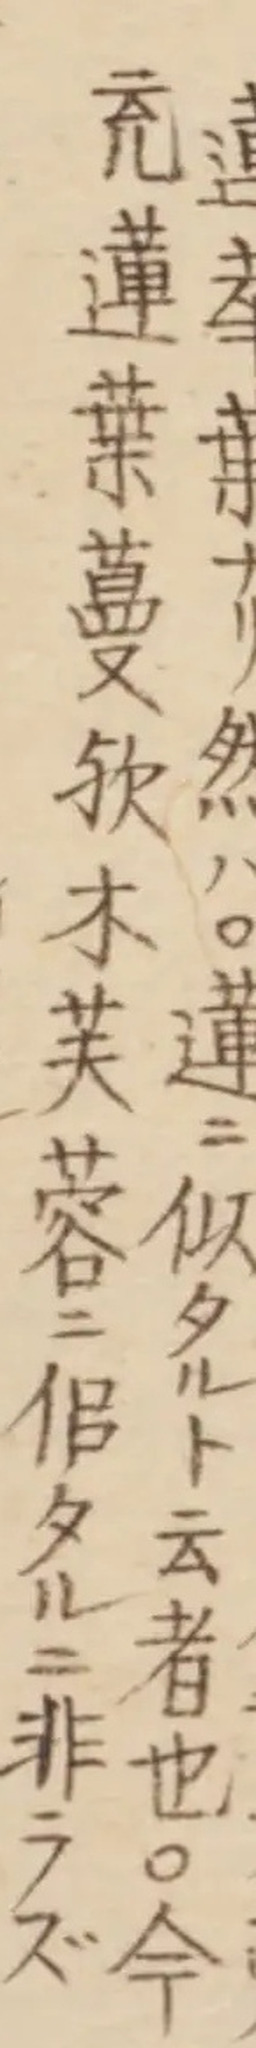充蓮葉蔓歟木芙蓉ニ似タルニ非ラズ
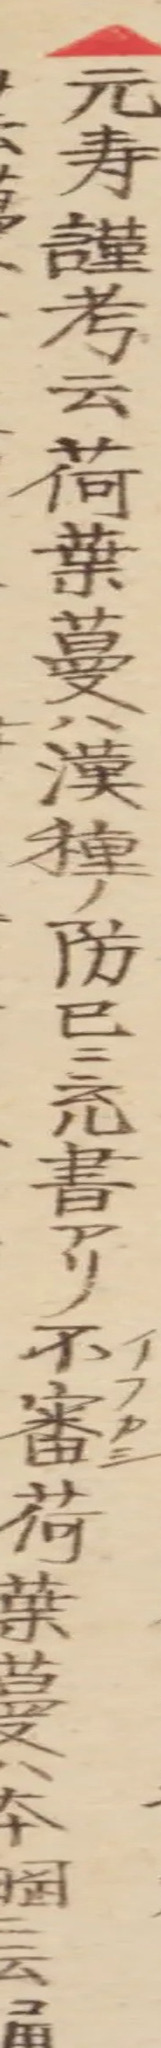▲元寿謹考云荷葉蔓ハ漢種ノ防巳ニ充書アリ不審荷葉蔓ハ本綱ニ云通脱木
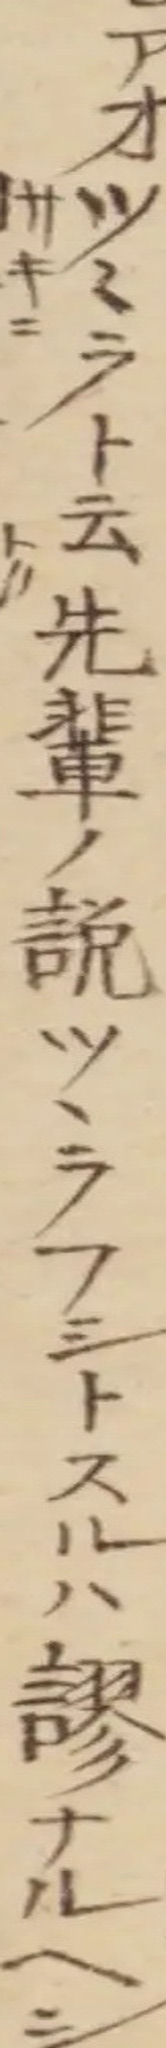○アオツ〻ラト云先輩ノ説ツヽラフシトスルハ謬ナルヘシ
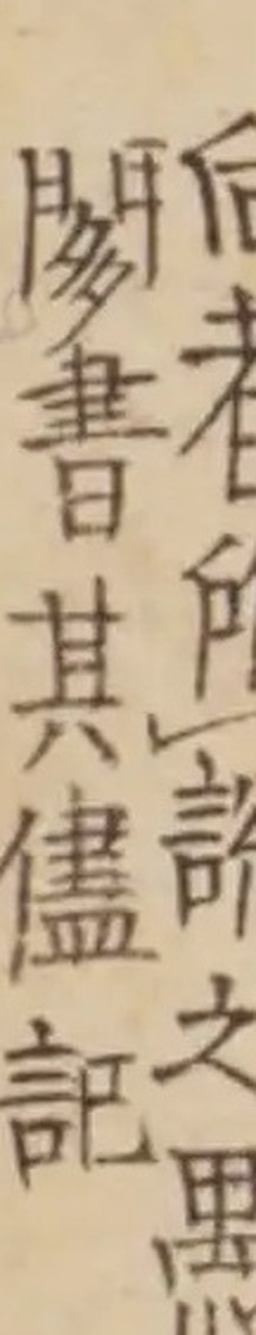𨴢書其儘記

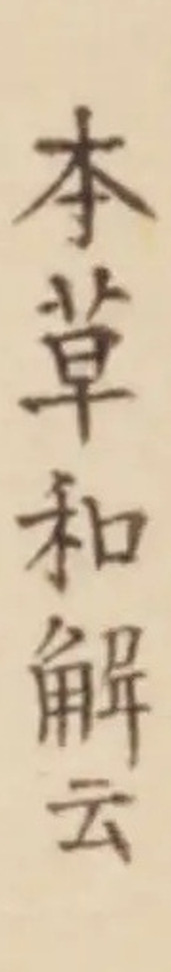本草和解云
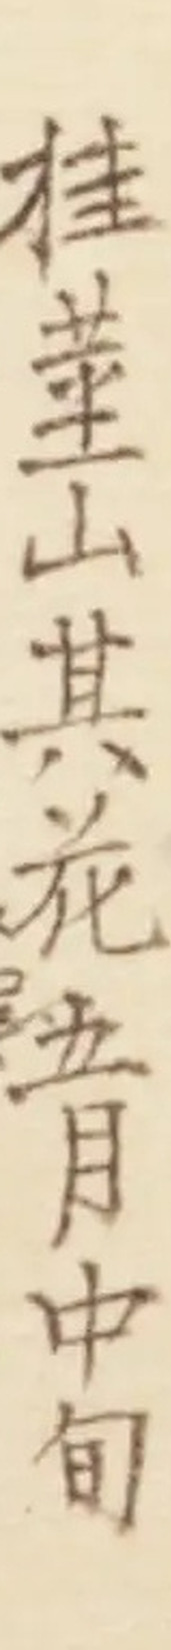桂茎山其花五月中旬
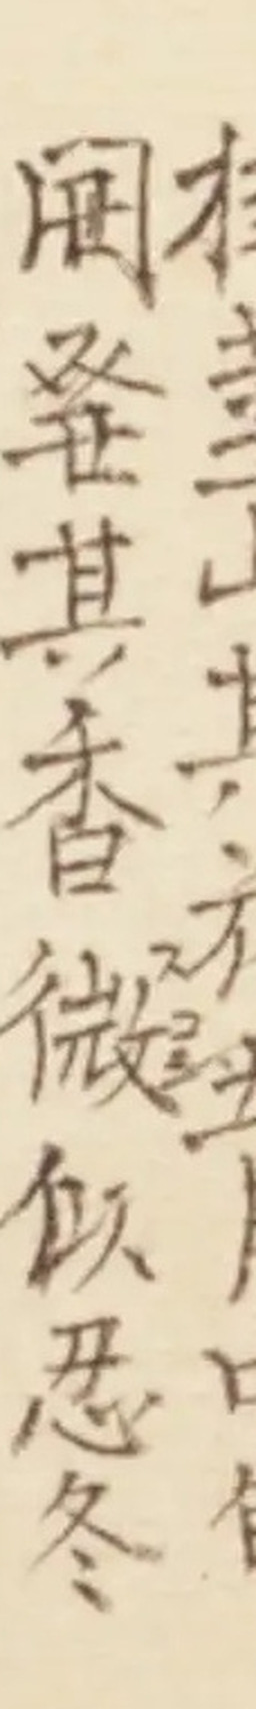開発其香微似忍冬
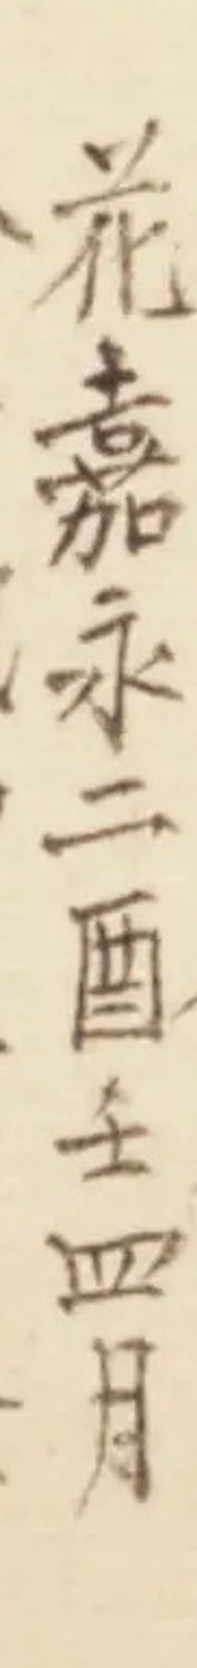花嘉永二酉壬四月
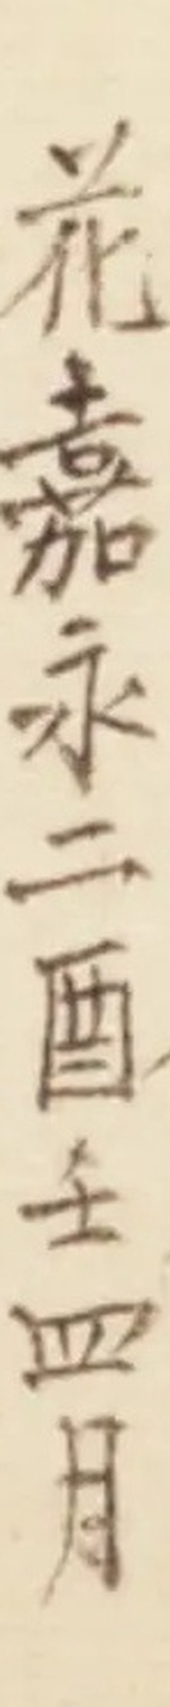花嘉永二酉壬四月
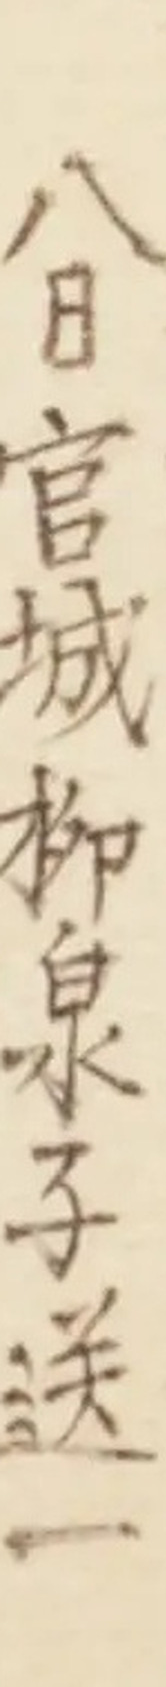八日宮城柳泉子送一
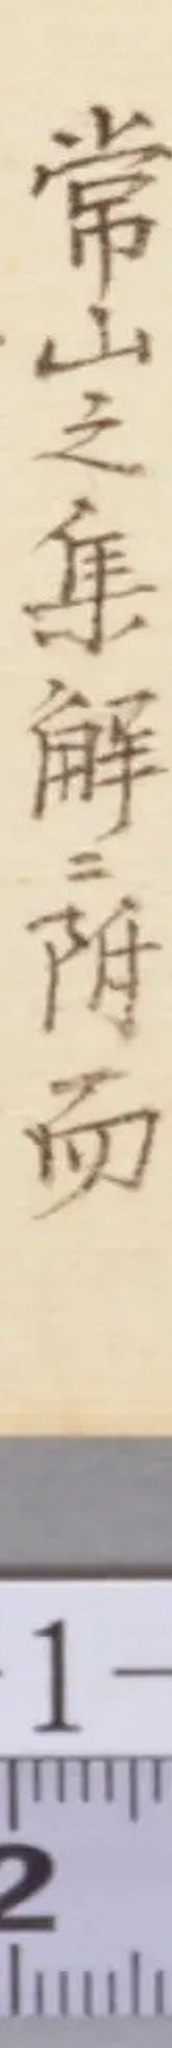常山之集解ニ附而
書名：梅園草木花譜秋之部. 1
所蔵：国立国会図書館 National Diet Library, JAPAN
